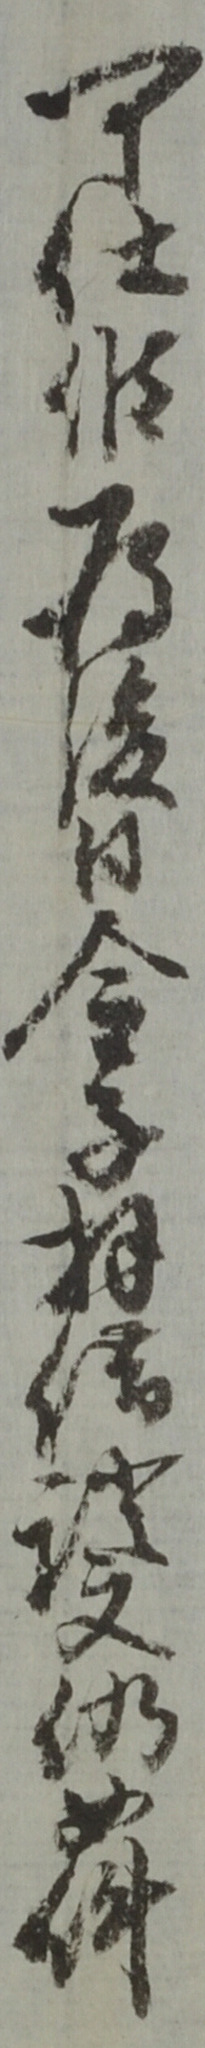可致候為後日金子拝借証文仍如件
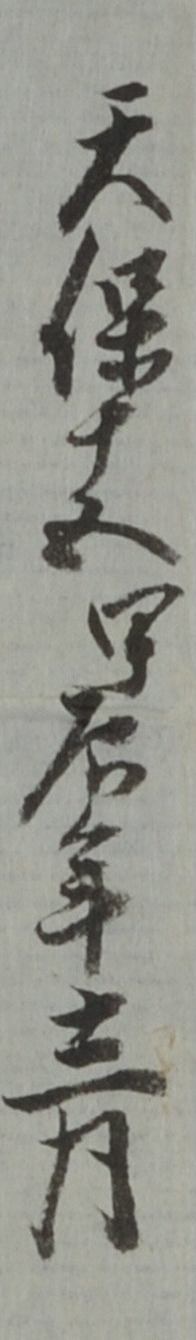天保十五甲辰年十二月
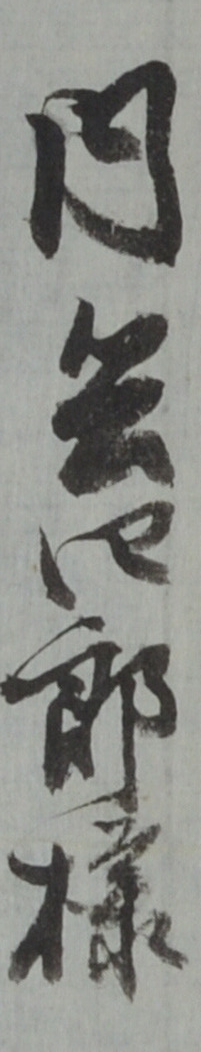内兵四郎様
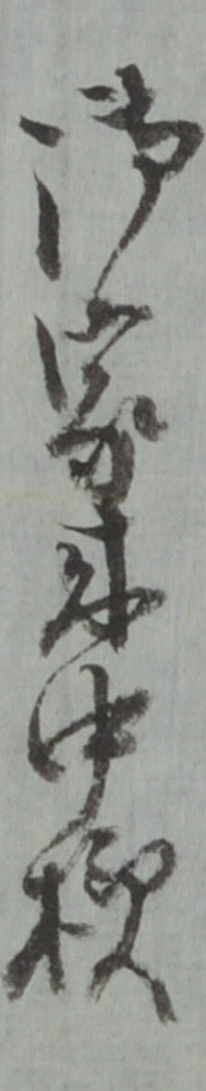御家来中様
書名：拝借證文之事
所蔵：伊那市立高遠町図書館・合同会社AMANE
